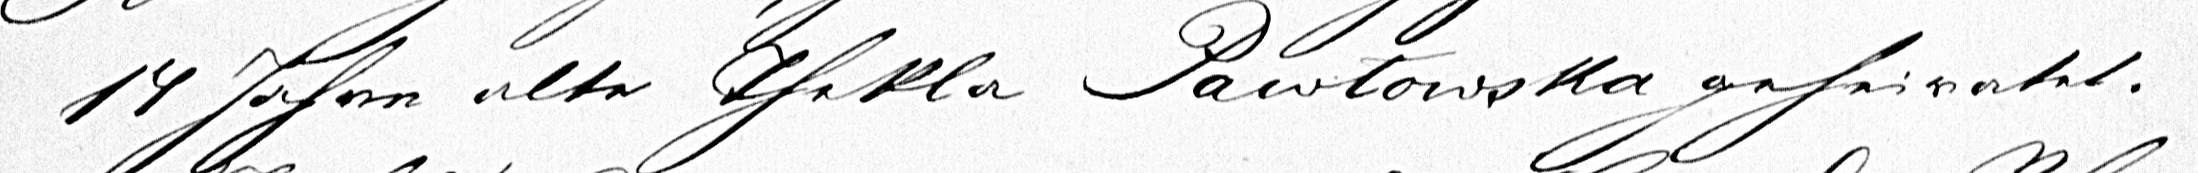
14 Jahre alte Thekla Pawtowska geheiratet.
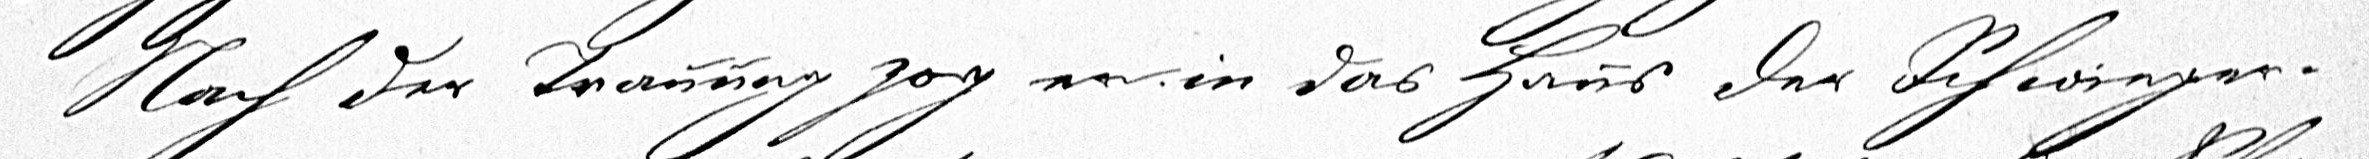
Nach der Trauung zog er in das Haus der Schwieger¬
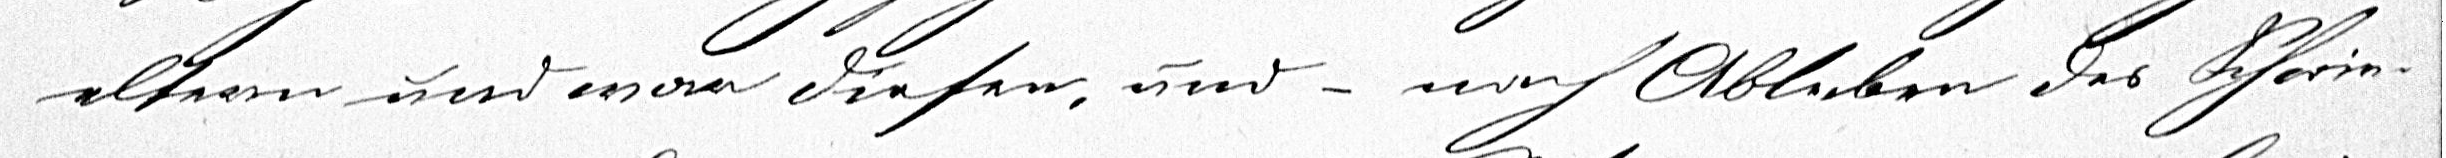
eltern und war diesen, und - nach Ableben des Schwie¬
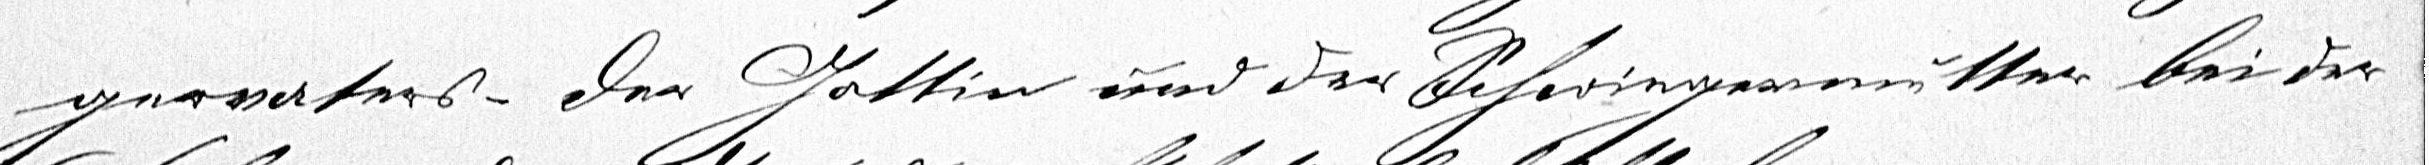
gervaters- der Gattin und der Schwiegermutter bei der
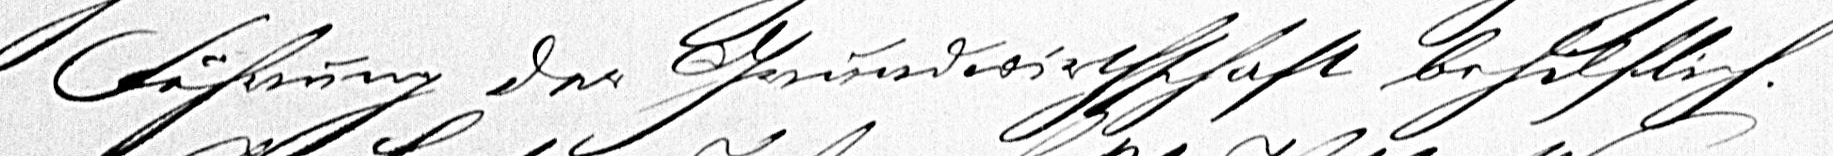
Führung derGrundwirthschaft behilflich.
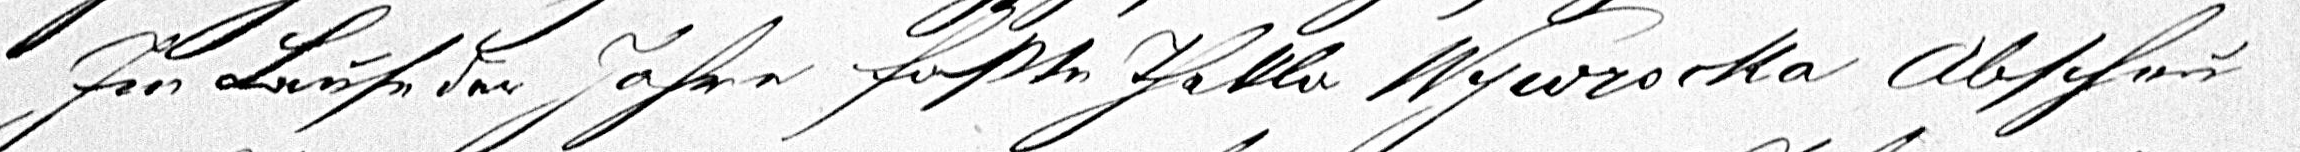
Im Laufe der Jahre faßte Thekla Wywrocka Abscheu
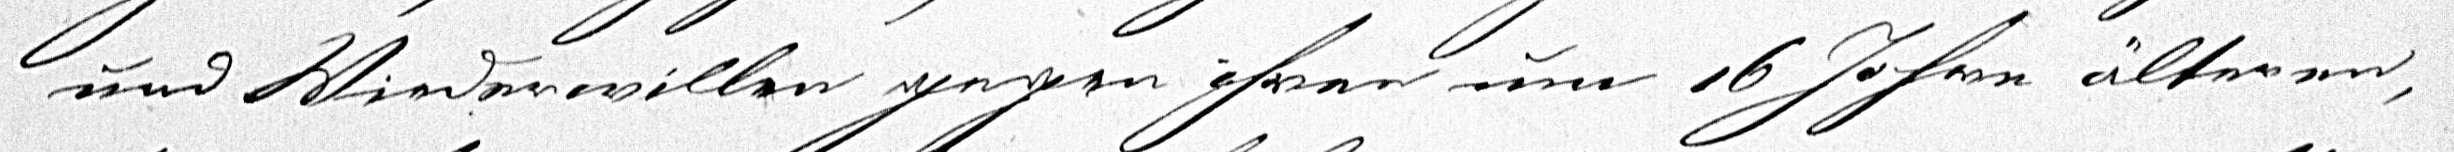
und Wiederwillen gegenihren um 16 Jahre älteren,
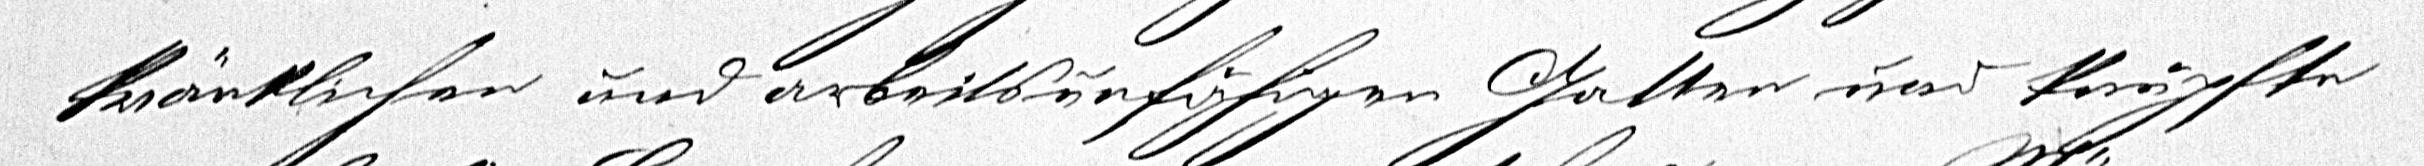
kränklichen und arbeitsunfähigen Gatten und knüpfte
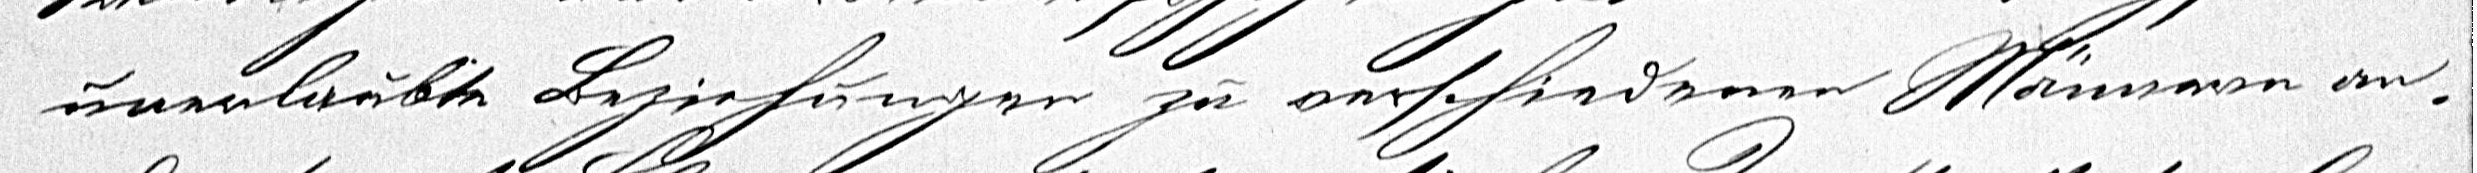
unerlaubte Beziehungen zu verschiedenen Männern an.
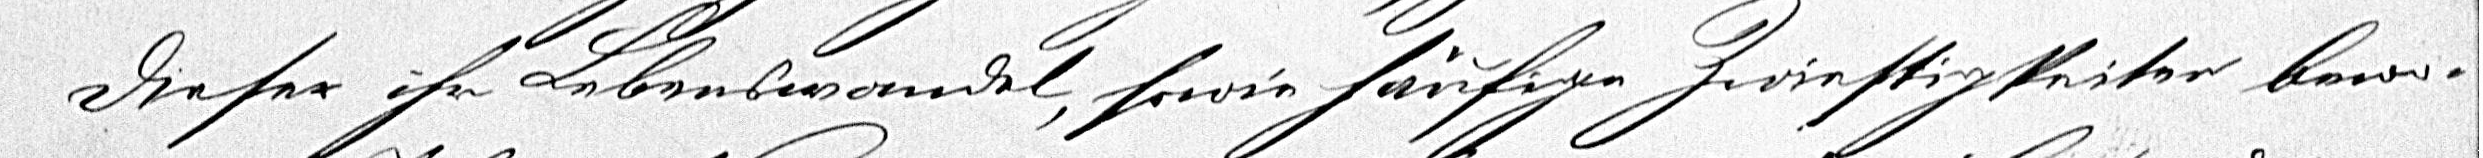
Dieser ihr Lebenswandel, sowie häufige Zwistigkeiten bewe¬
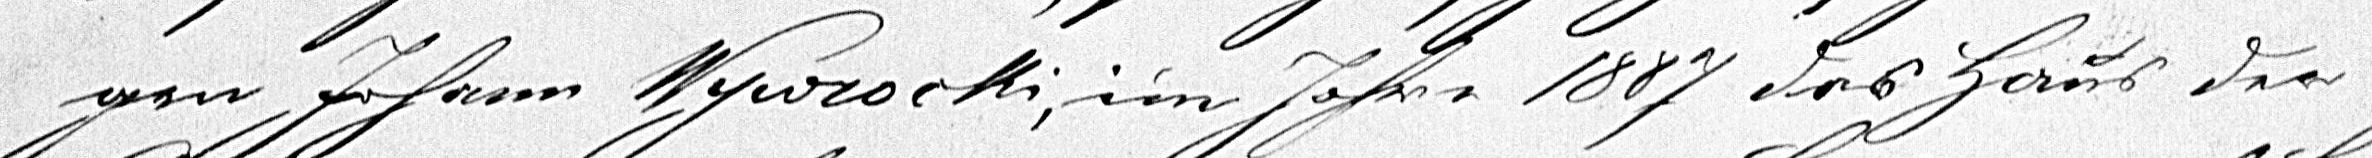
gen Johann Wywrzocki, im Jahre 1887 das Haus der
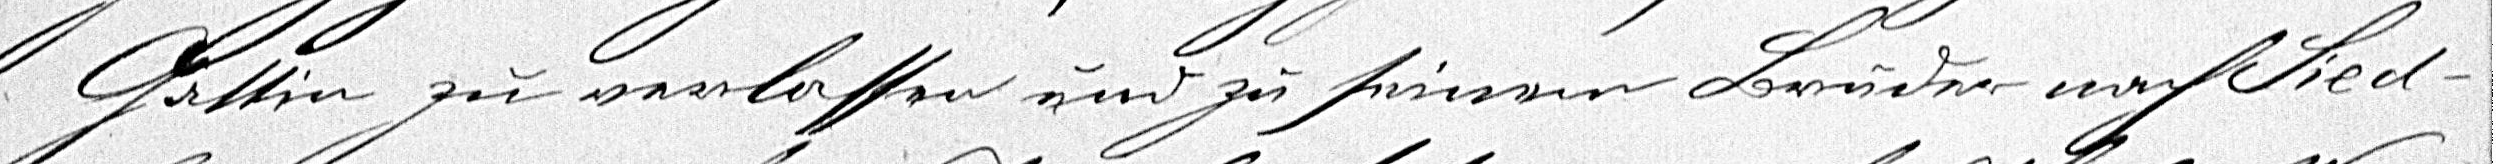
Gattin zu verlassen und zu seinem Bruder nach Sied¬
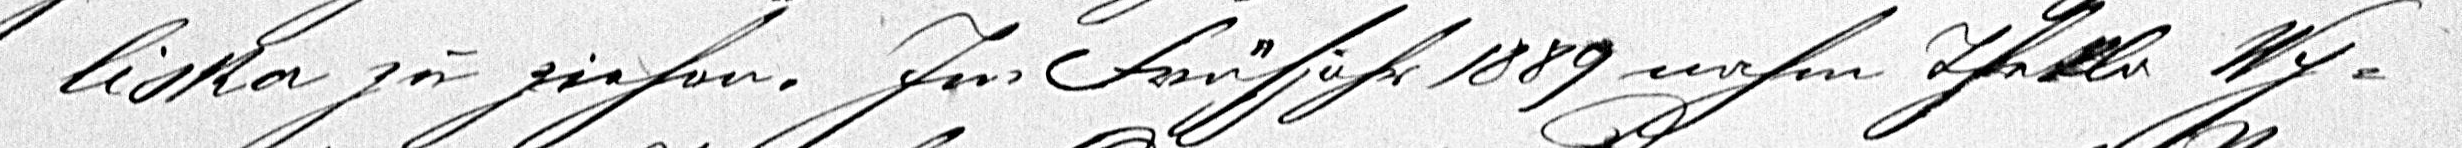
liska zu ziehen. Im Frühjahr 1889 nahm Thekla Wy¬
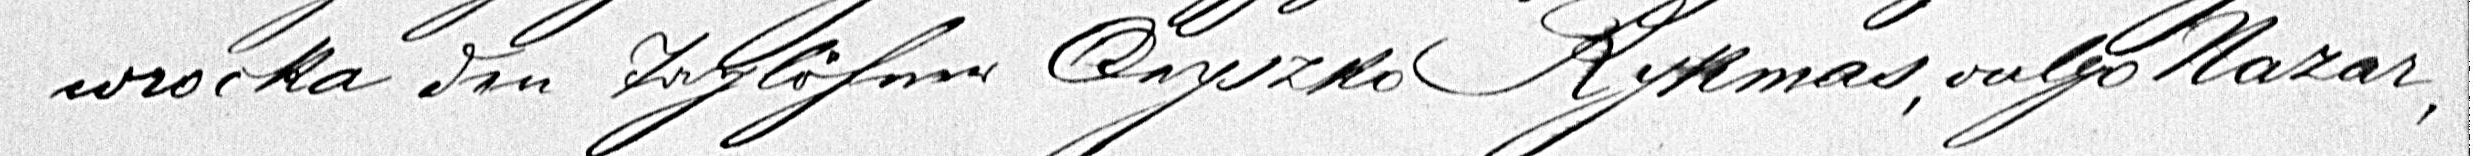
wrocka den Taglöhner OnyszkoRykmas, vulgo Nazar,
